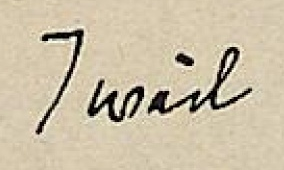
weil
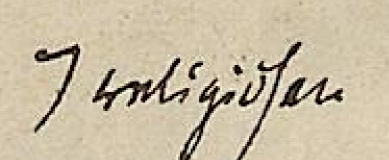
religiösen
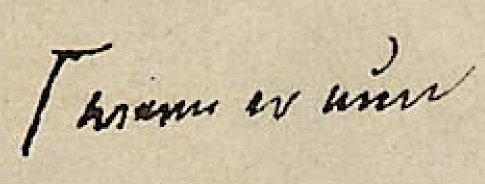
wenn er nunn
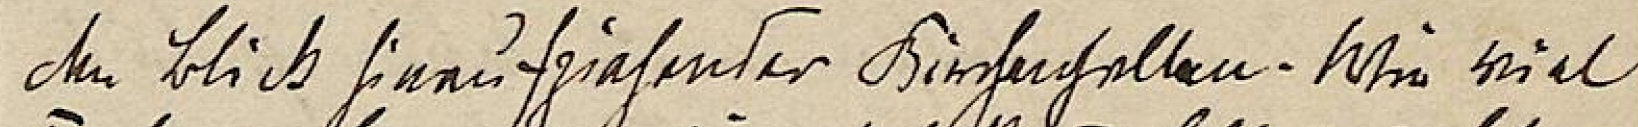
den Blick hinaufziehender Kirchenhallen. Wie viel
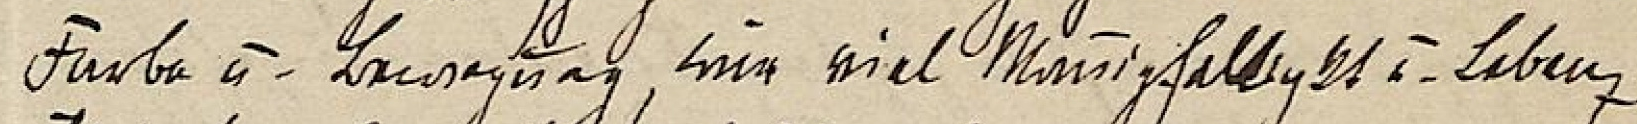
Farbe u. Bewegung, wie viel Manigfaltigkt. u. Leben,
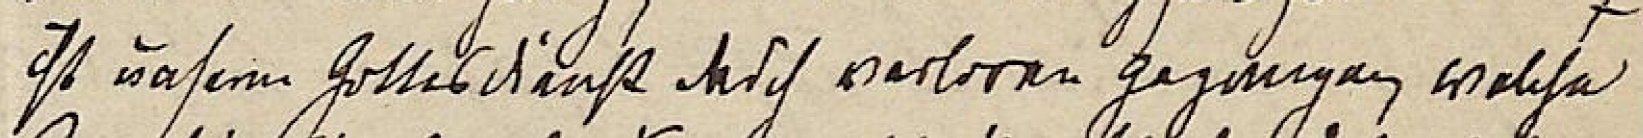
ist unserm Gottesdienst dadch verloren gegangen, welche
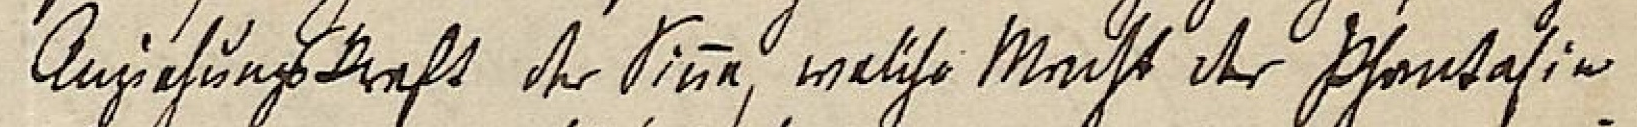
Anziehungskraft der Sine, welche Macht der Phantasie
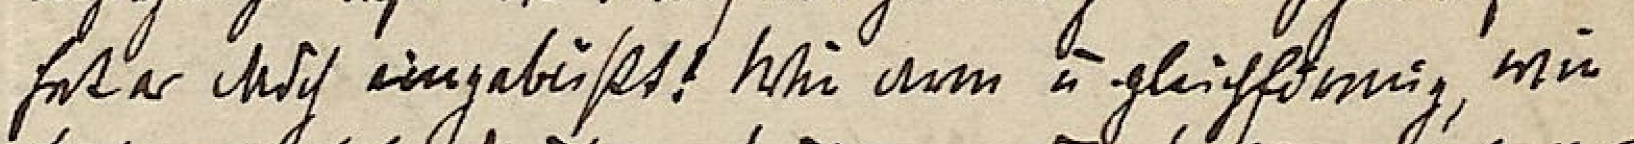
hat er dadch eingebüßt! Wie arm u. gleichförmig, wie
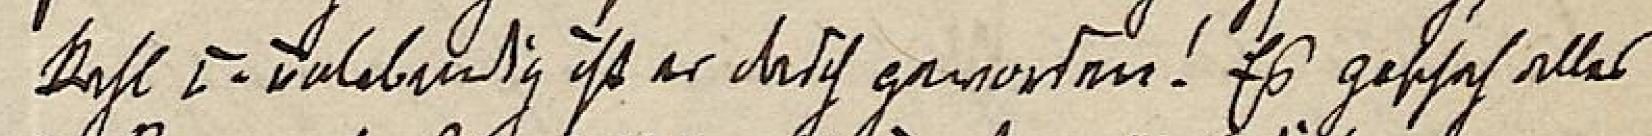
kahl u. unlebendig ist er dadch geworden! Es geschah alles
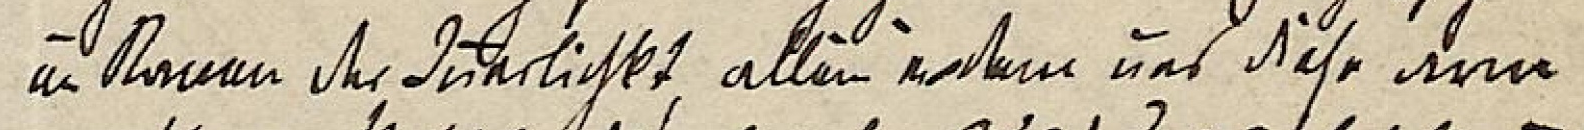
im Namen der Inerlichkt., allein indem uns diese arm
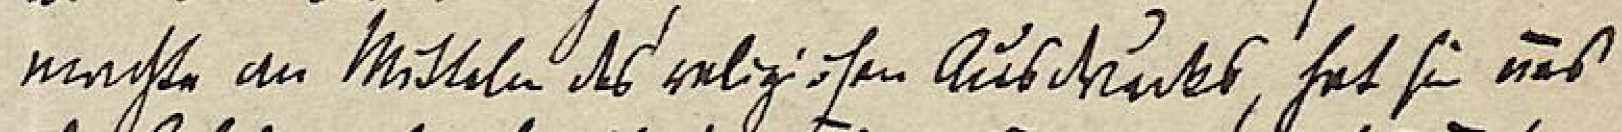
machte an Mitteln des religiösen Ausdrucks, hat sie uns
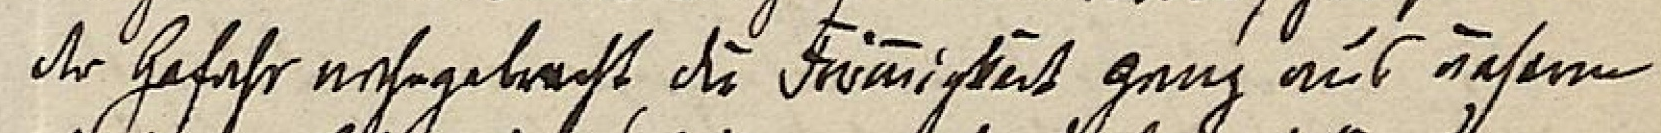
der Gefahr nahegebracht die Frömigkeit ganz aus unserm
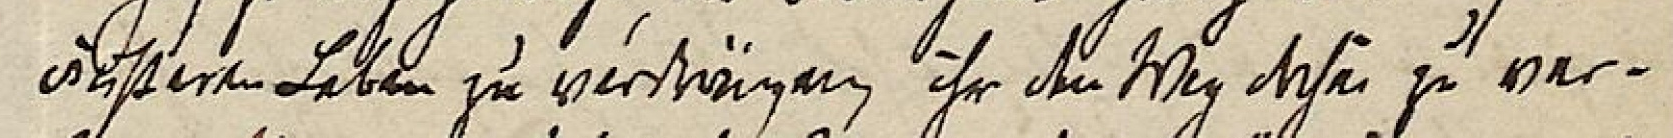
äußeren Leben zu verdrängen, ihr den Weg dahin zu ver¬
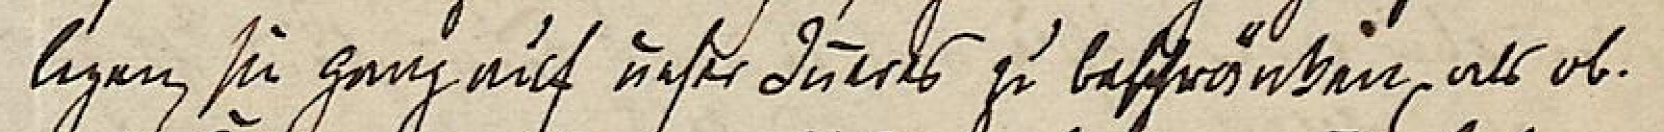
legen, sie ganz auf unser Ineres zu beschränken, als ob
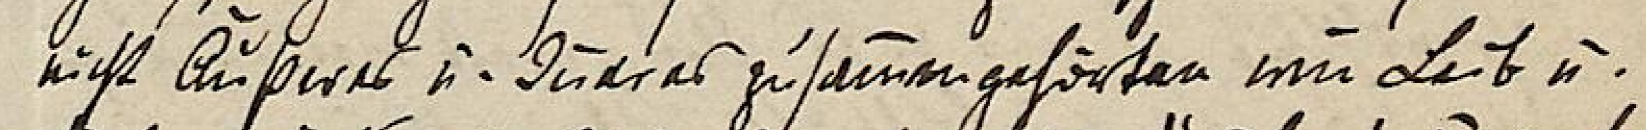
nicht Äußeres u. Ineres zusamengehörten wie Leib u.
